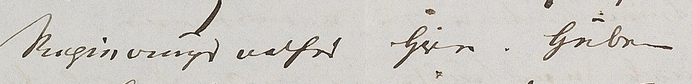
Regierungsrathes Hrn. Huber
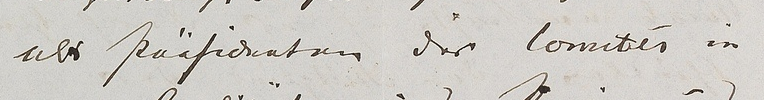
als Präsidenten des Comités in
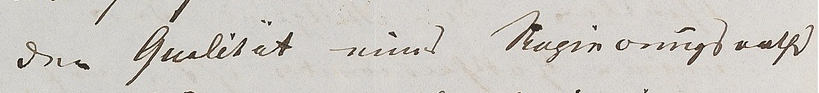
der Qualität eines Regierungsrathes
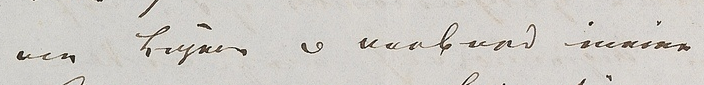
von Luzern & verband meine
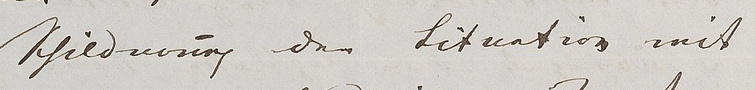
Schilderung der Situation mit
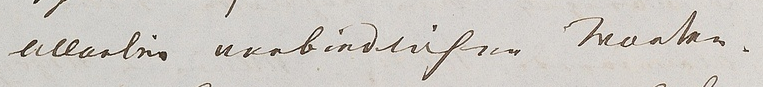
allerlei verbindlichen Worten.
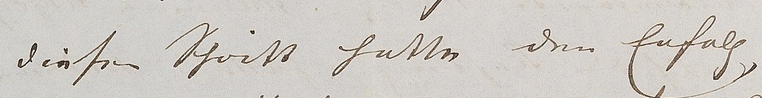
Dieser Schritt hatte den Erfolg,
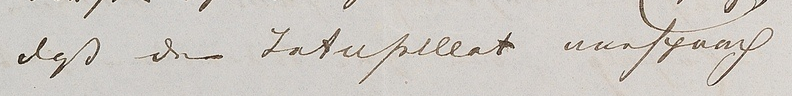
dass der Interpellat versprach
